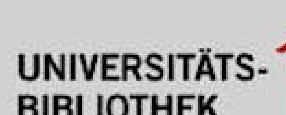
oeriitdeid¬
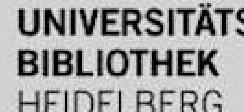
ist lsblub
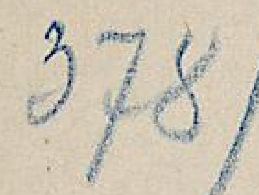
378
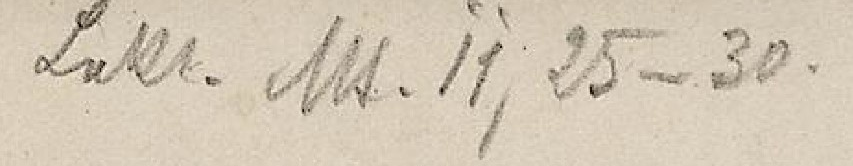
Lect. Mt. 11, 25- 304
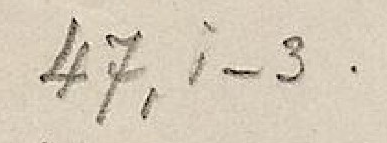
47,1-3.
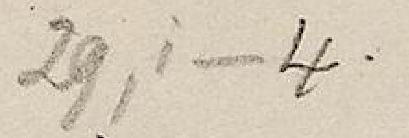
29,1-4.
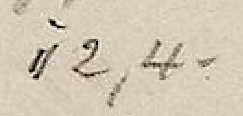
112,4..
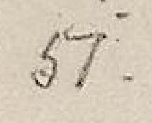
57.
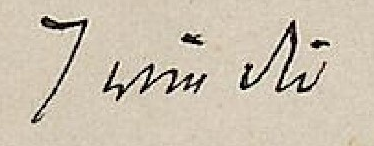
] wie die
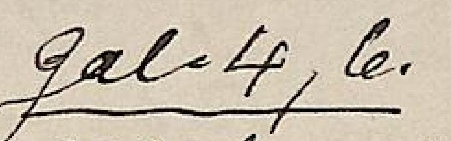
Gal. 4,6.
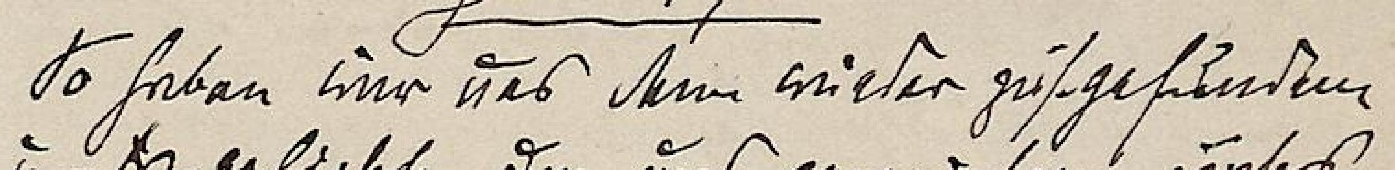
So haben wir und denn wieder zus.gefunden
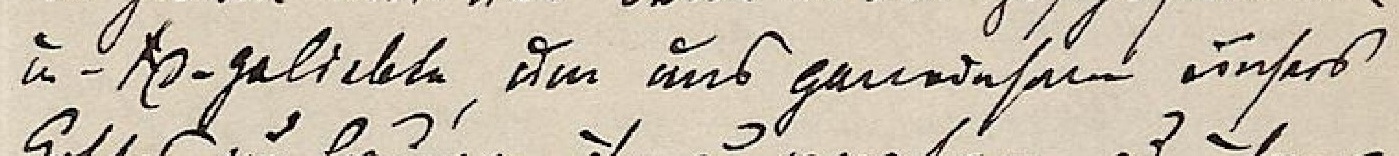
in Χρ. geliebte, um uns gemeinsam unseres
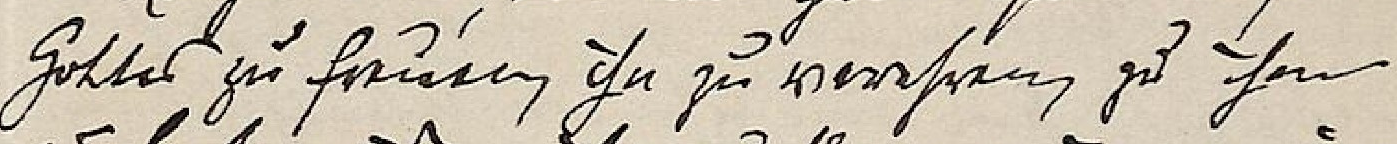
Gottes zu freuen, ihn zu verehren, zu ihm
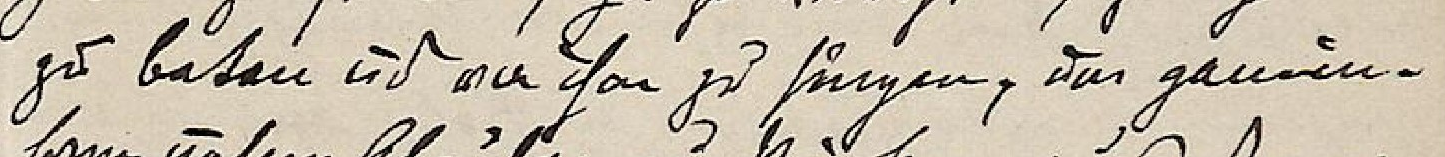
zu beten und von ihm zu singen, um gemein¬
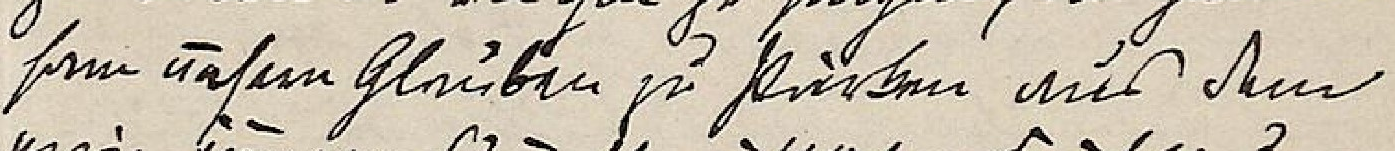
sam unsern Glauben zu stärken, aus dem
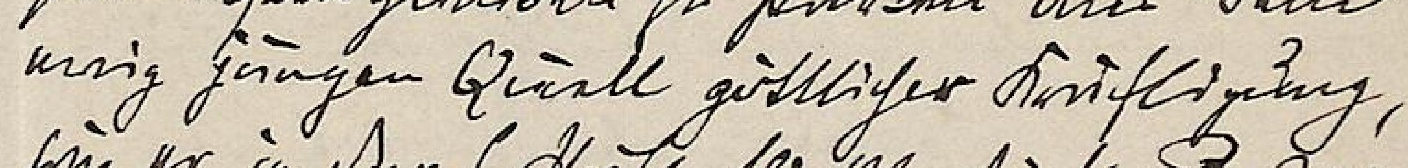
ewig jungen Quell göttlicher Kräftigung,
